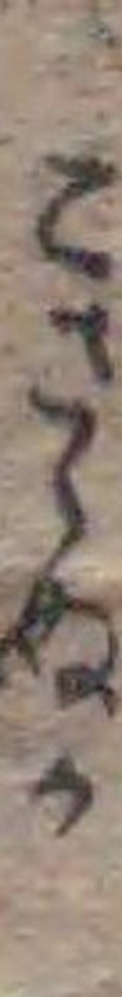こさらぬか

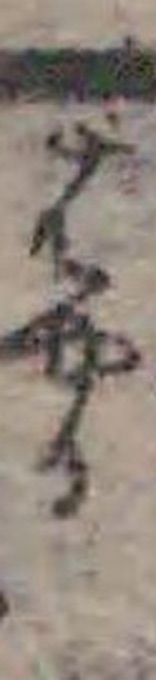はやる
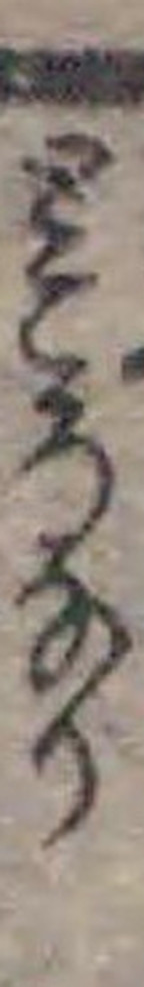ところなり
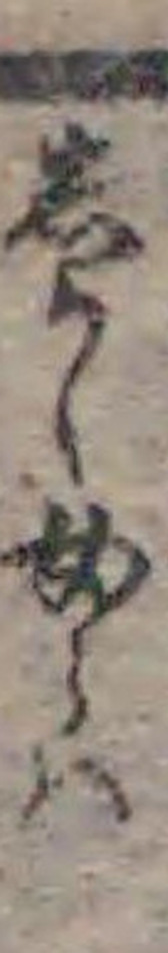しかし女郎は
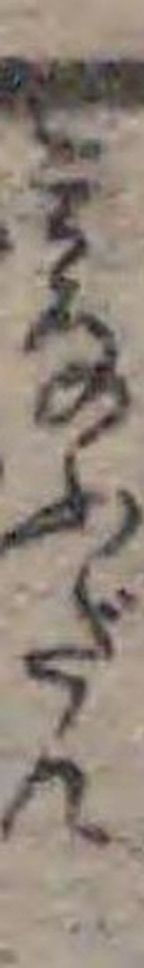みなふだん
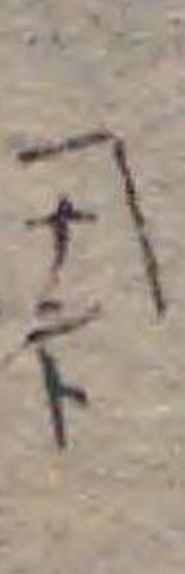〽ナント
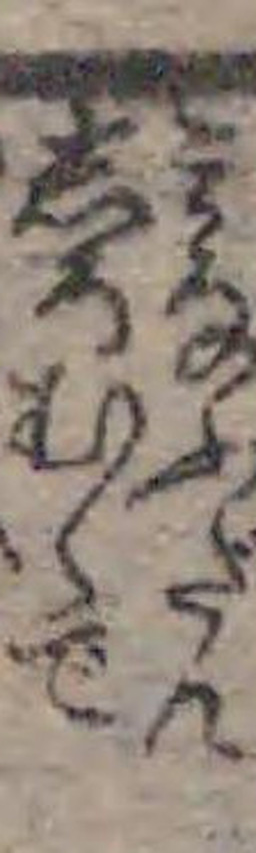しろむくで
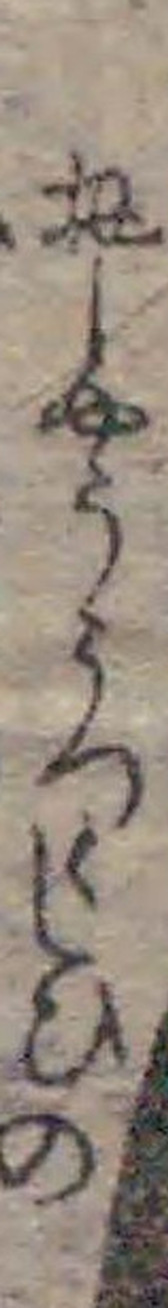おしやううつくしひの
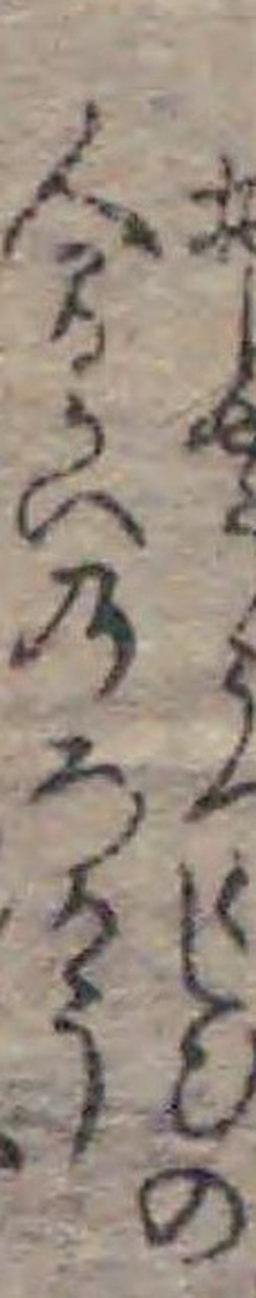人間かいのろかう
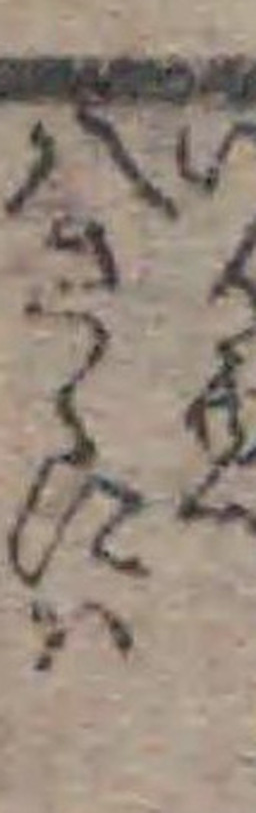八さくには
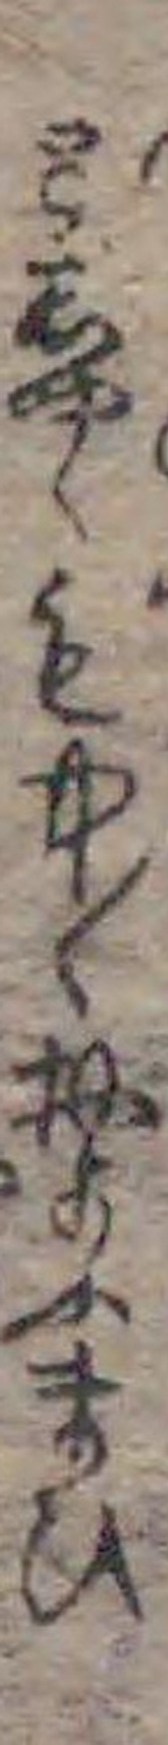としやくも中〳〵およふまひ
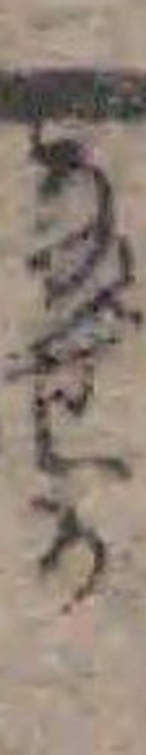なぜか
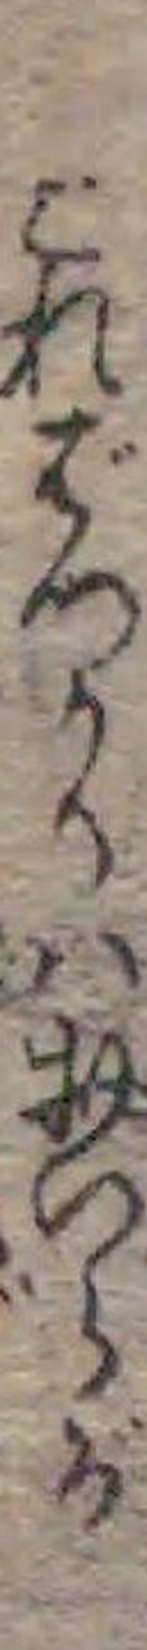こればつかりはおいらが
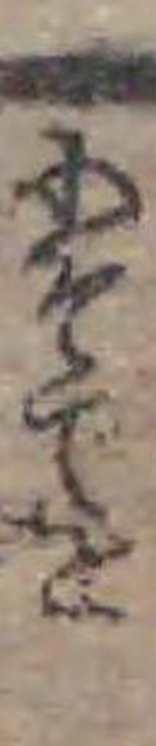小そでを
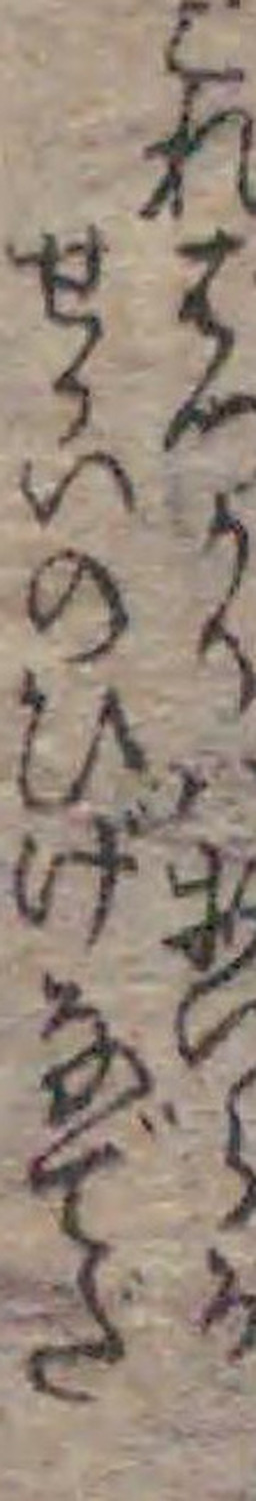せかいのひげなでだ
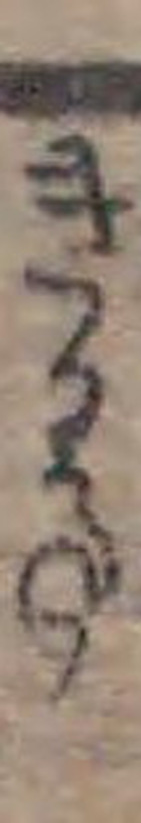きる事
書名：年中行状記 : 2巻
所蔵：国立国会図書館 National Diet Library, JAPAN
